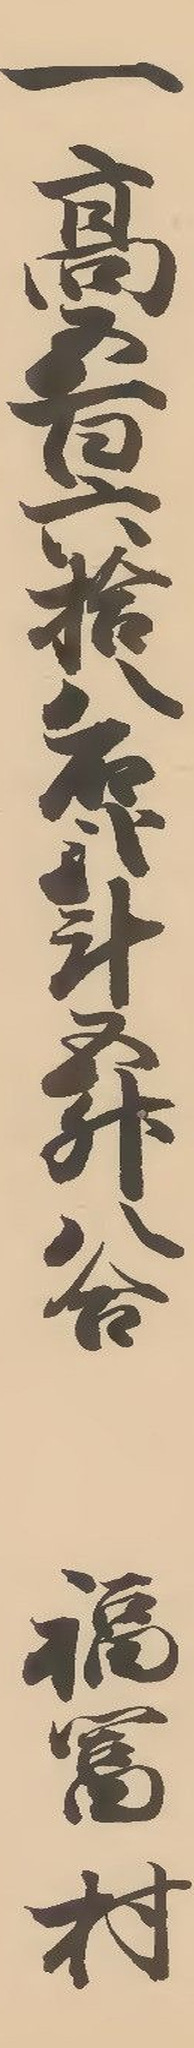一髙五百六拾八石弐斗五升八合福冨村
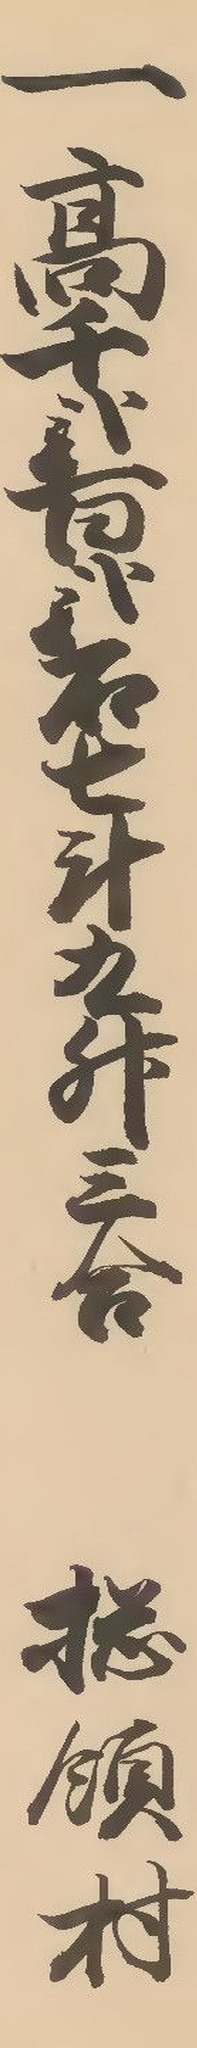一髙千弐百弐石七斗九升三合惣領村
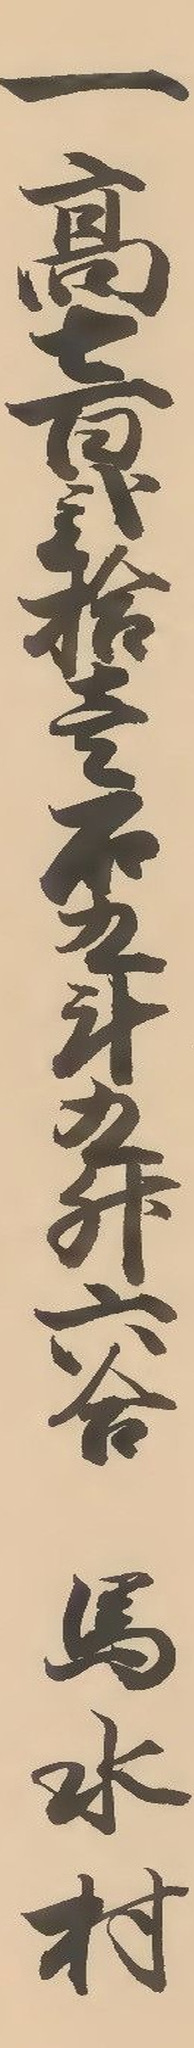一髙七百弐拾壱石九升九升六合馬水村
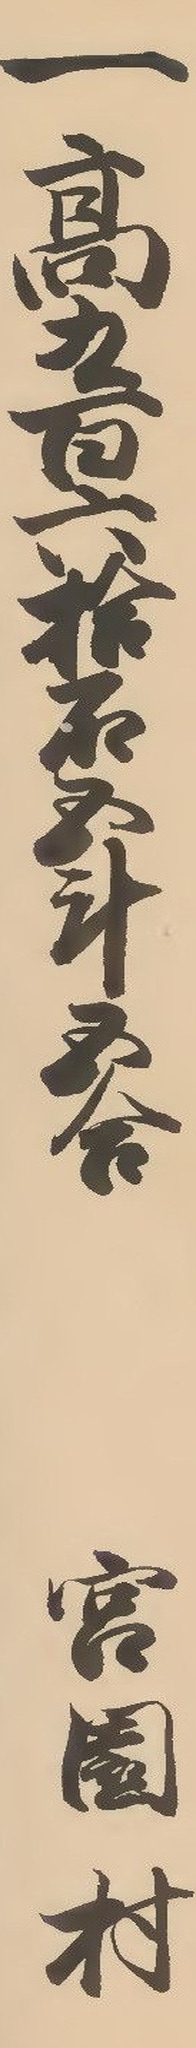一髙九百六拾石五斗五合宮薗村
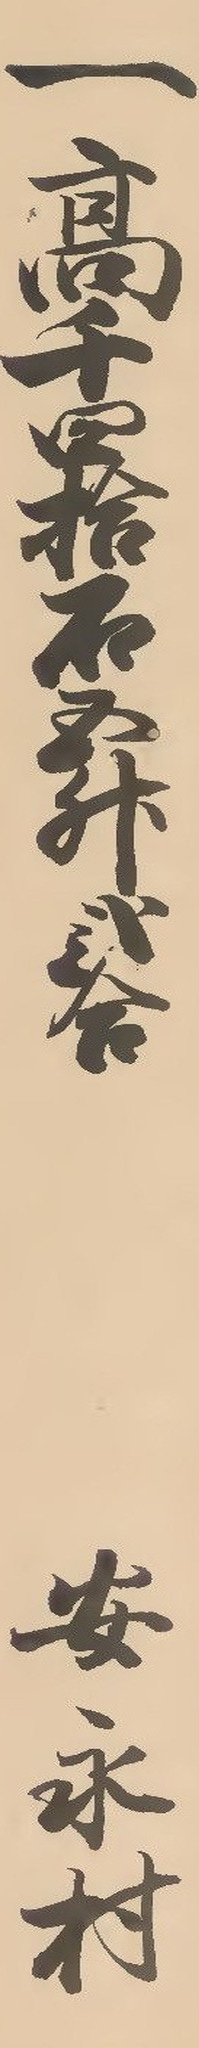一髙千四拾石五斗弐合安永村
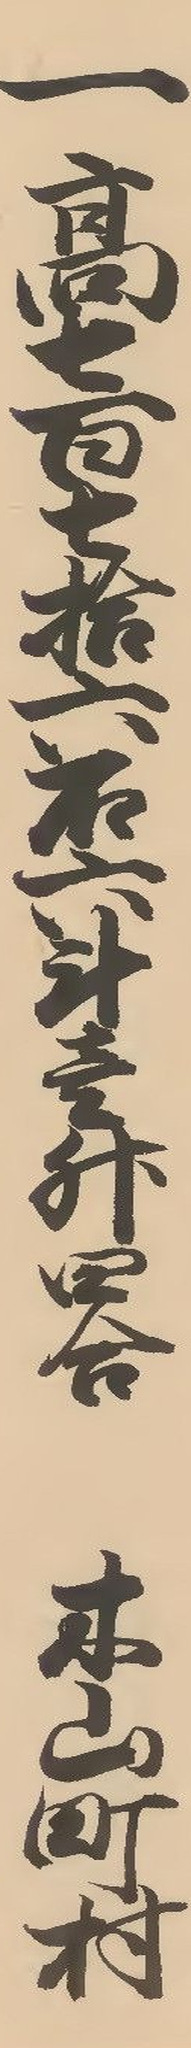一髙七百七拾六石六斗壱升四合木山町村
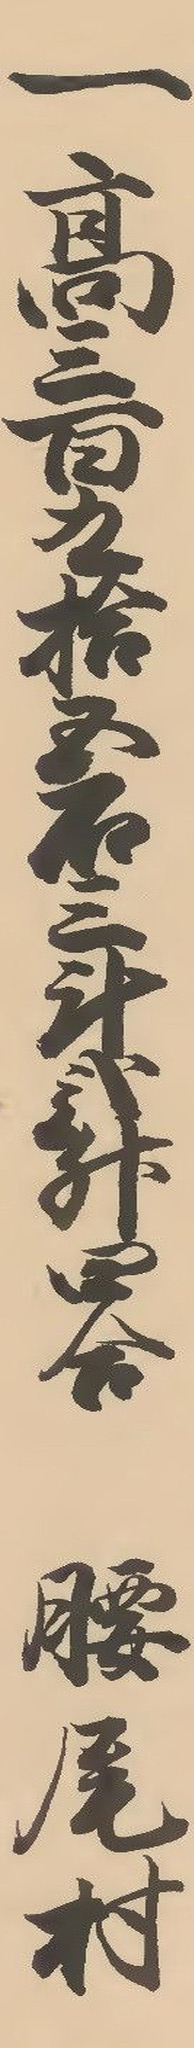一髙三百九拾五石三斗弐升四合腰尾村
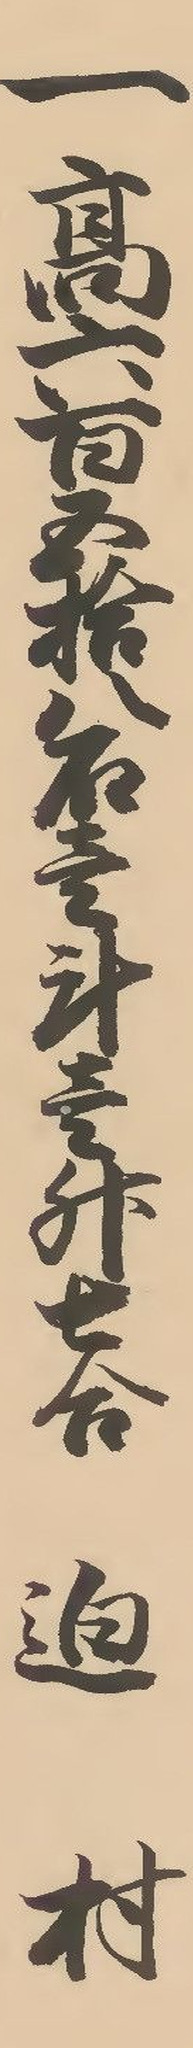一髙六百五拾八石壱斗壱升七合迫村

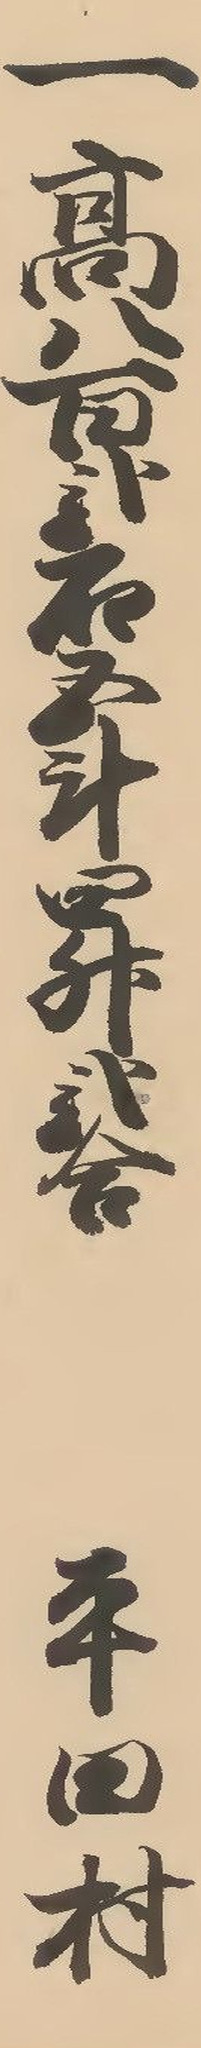一髙八百弐石五斗四升弐合平田村
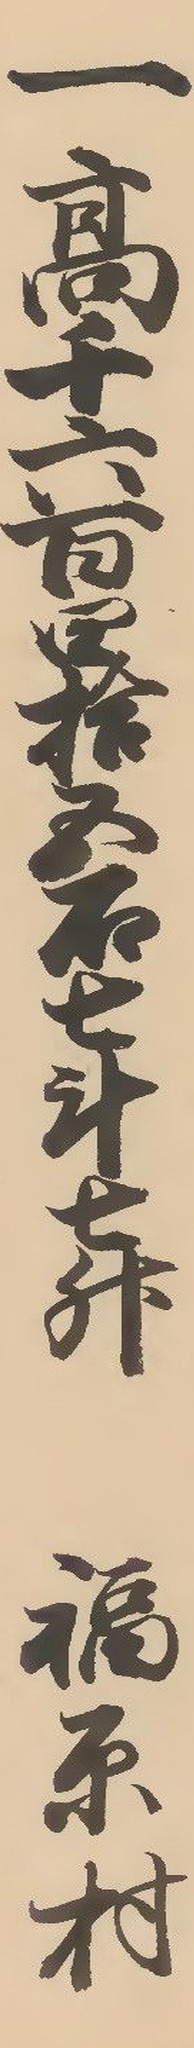一髙千六百四拾五石七斗七升福原村
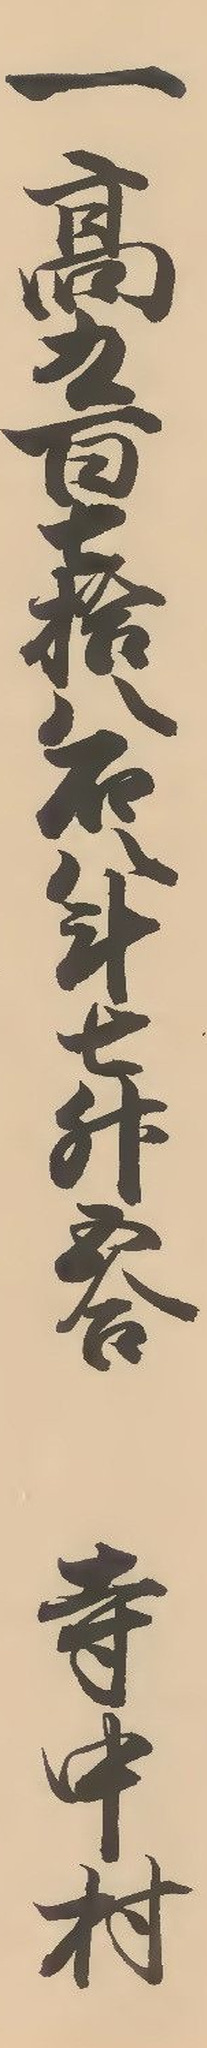一髙九百七拾八石八斗七升五合寺中村
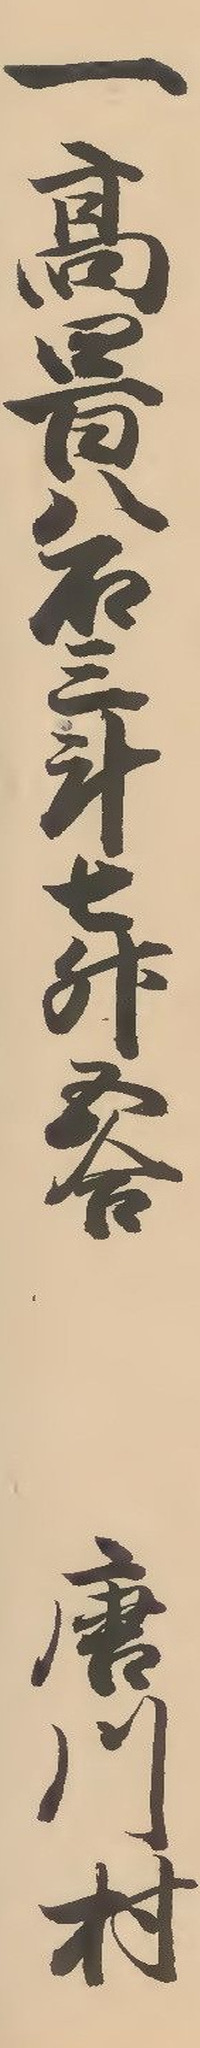一髙四百八石三斗七升五合唐川村
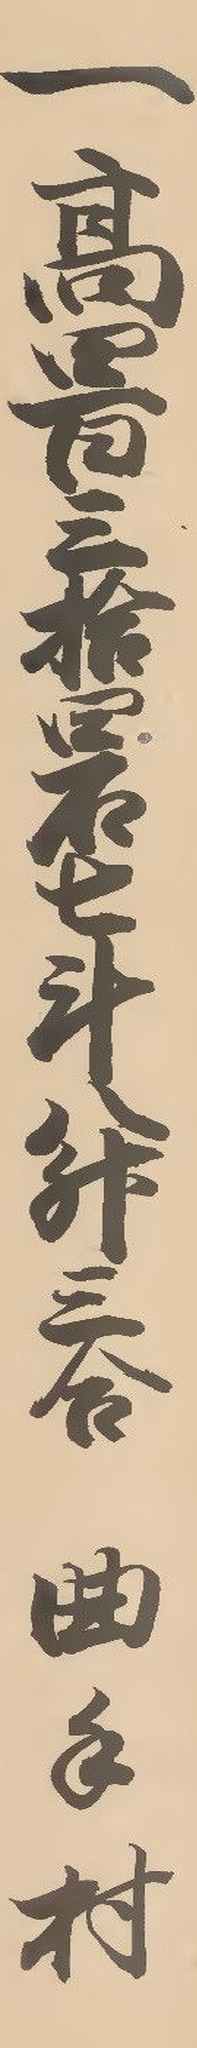一髙四百三拾四石七斗八升三合曲手村
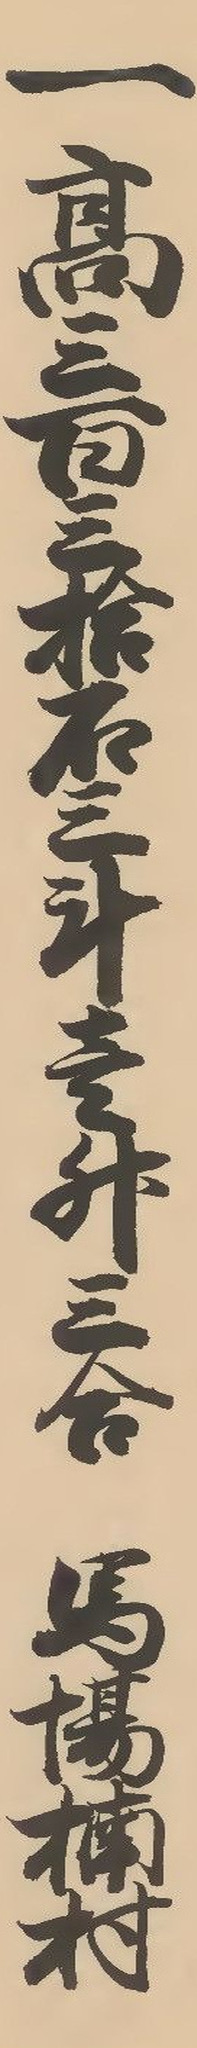一髙三百三拾石三斗壱升三合馬場楠村
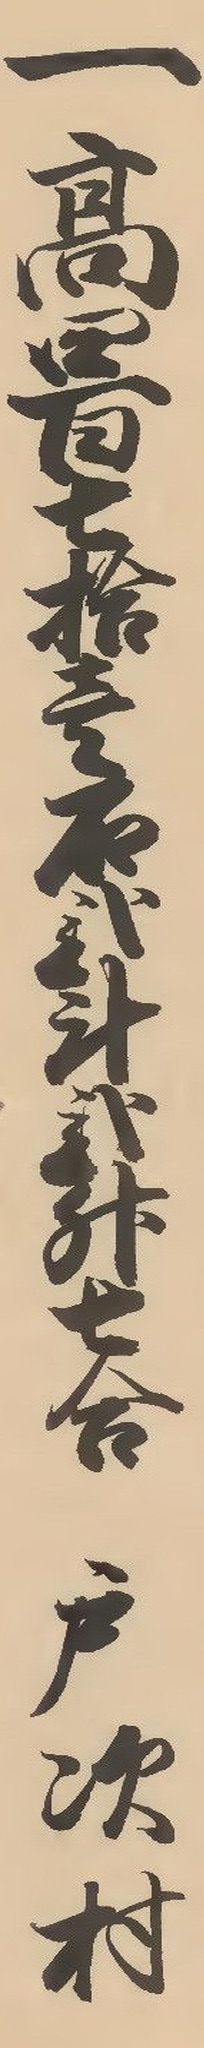一髙四百七拾壱石弐斗弐升七合戸次村
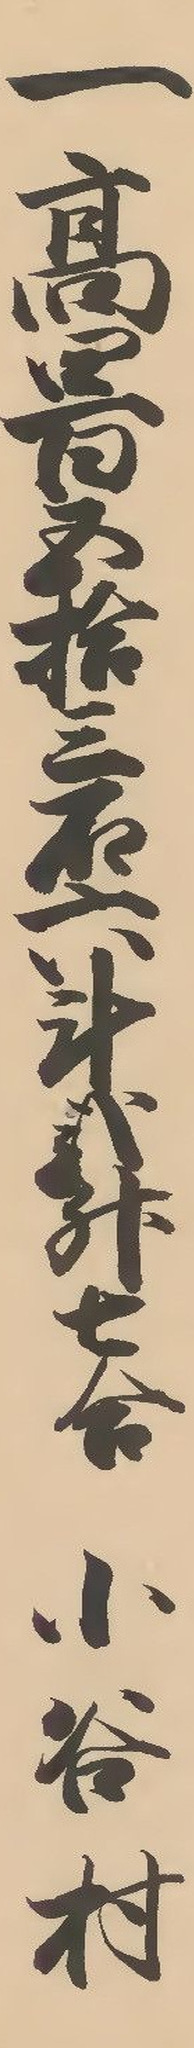一髙四百五拾三石六斗弐升七合小谷村
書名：肥後国郷帳
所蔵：国立公文書館 National Archives of Japan
